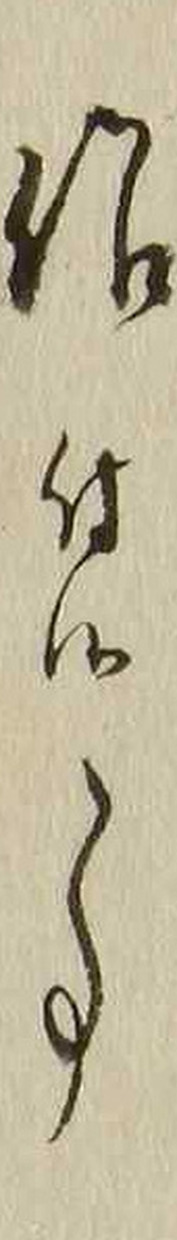仰付候事
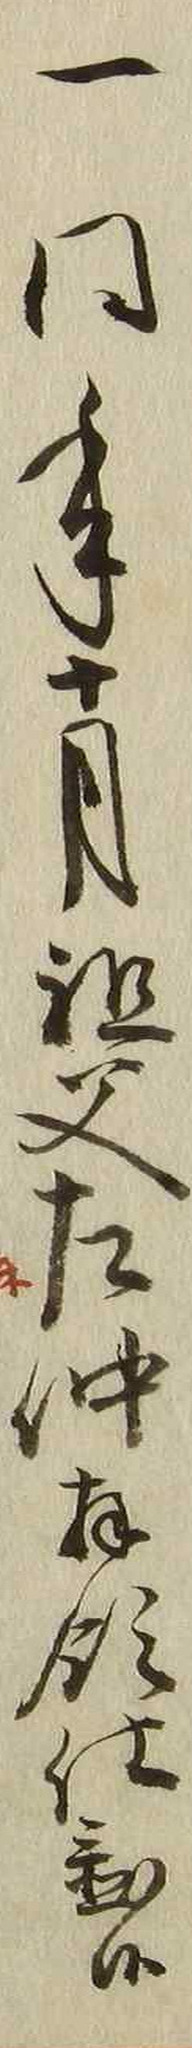一同年十月祖父左沖拝領仕置候
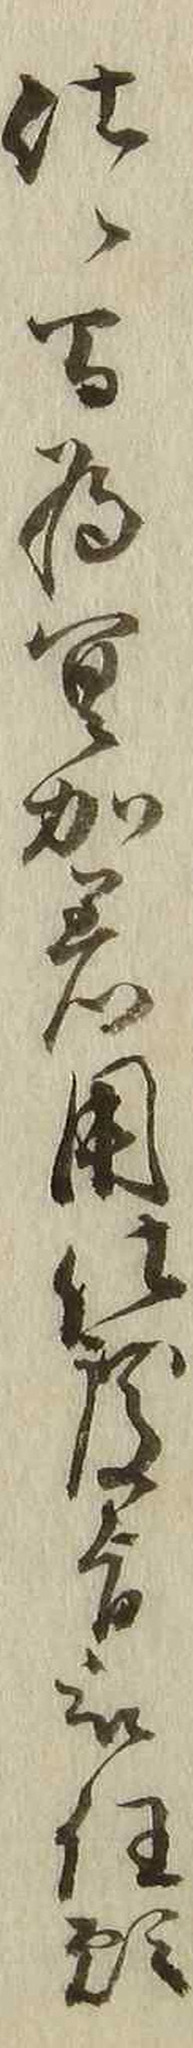仕候間為冥加着用仕度旨被任願
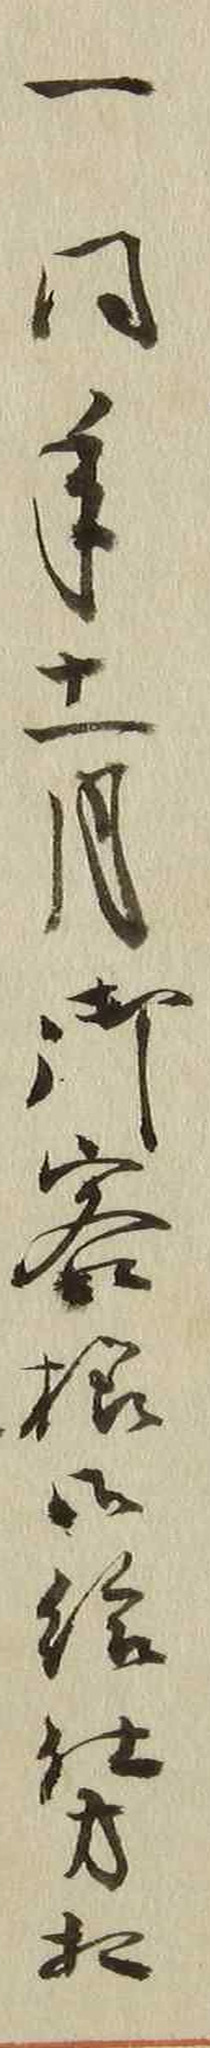一同年十一月御客様御給仕方相
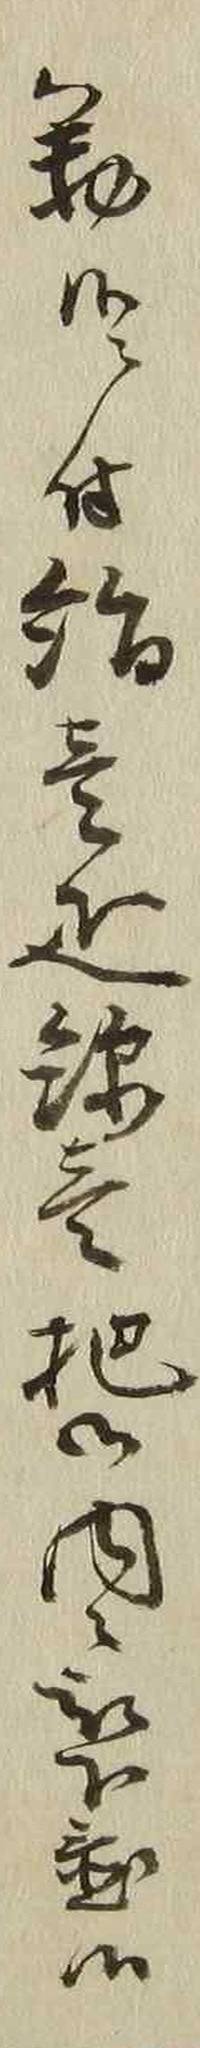勤候ニ付絹壱疋綿壱把御内々被下置候
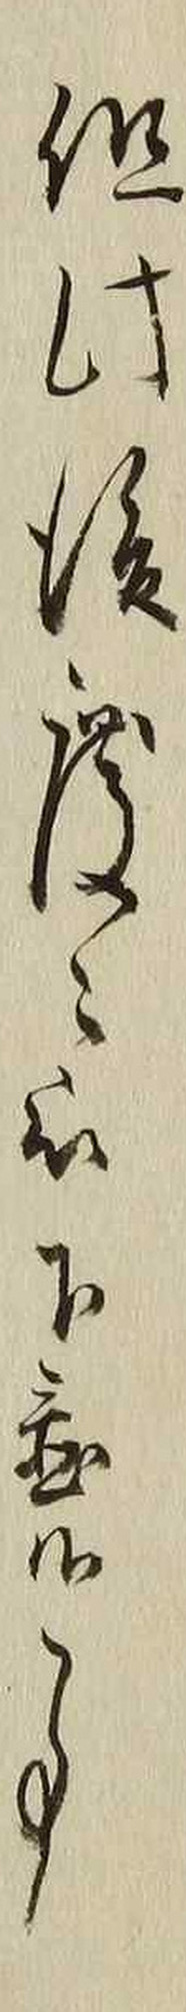但此後度々被下置候事
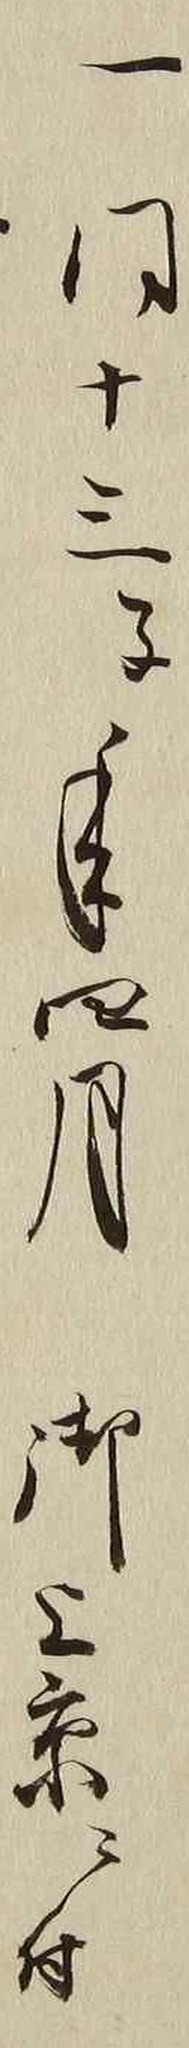一同十三子年四月御上京ニ付
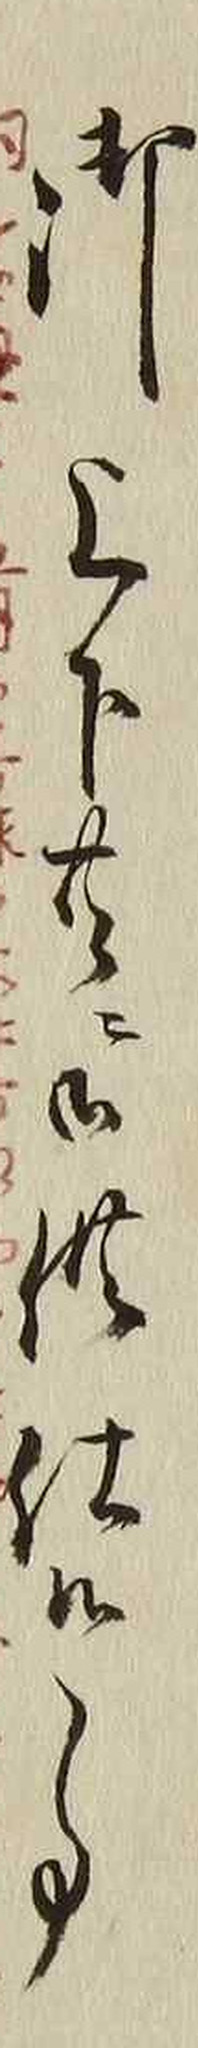御上下共ニ御供仕候事
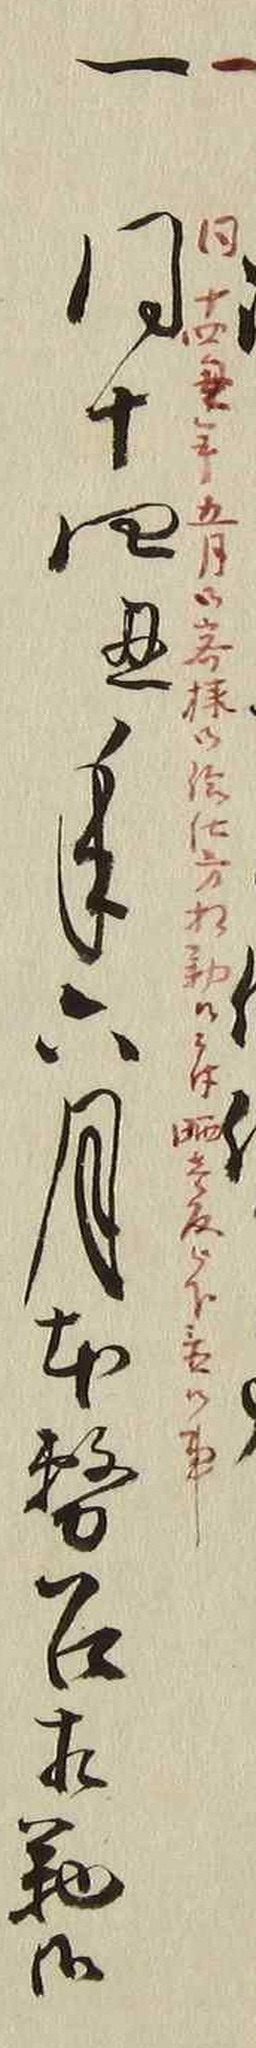一同十四丑年六月本務乍相勤御
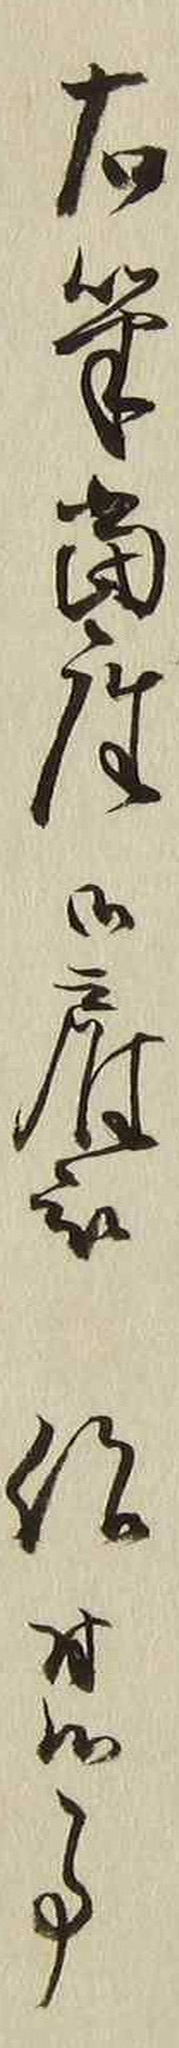右筆当座御雇被仰付候事
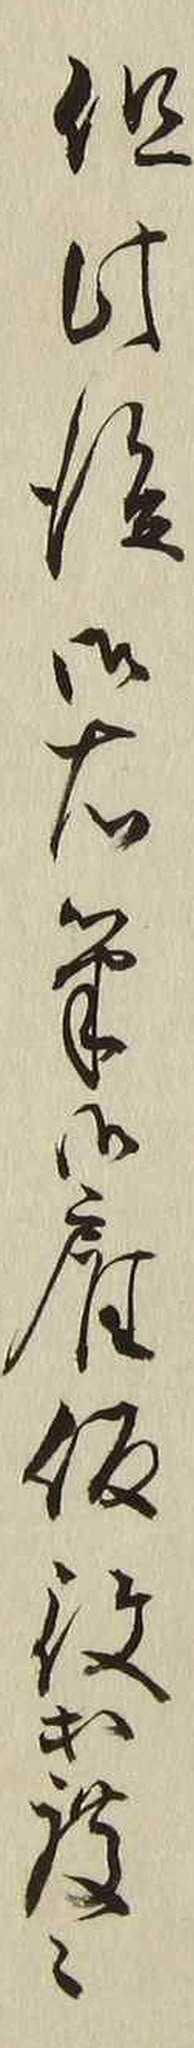但此後御右筆御雇仮役等度々
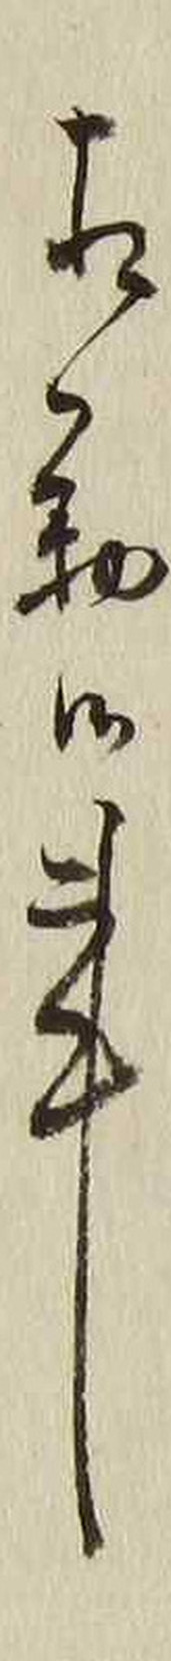相勤候事
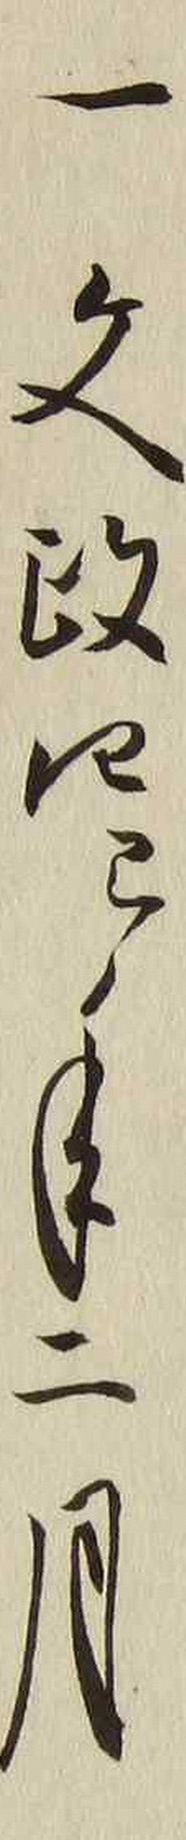一文政四巳年二月
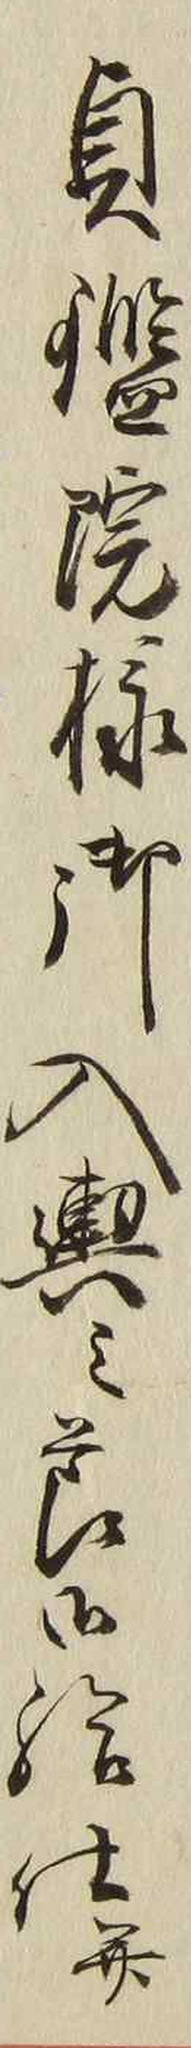貞鑑院様御入輿之節御給仕并
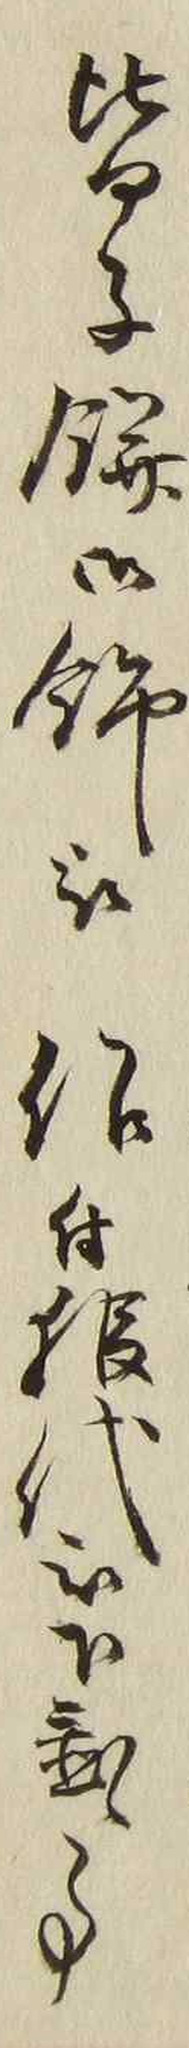皆子餅御飾被仰付服代被下置候事

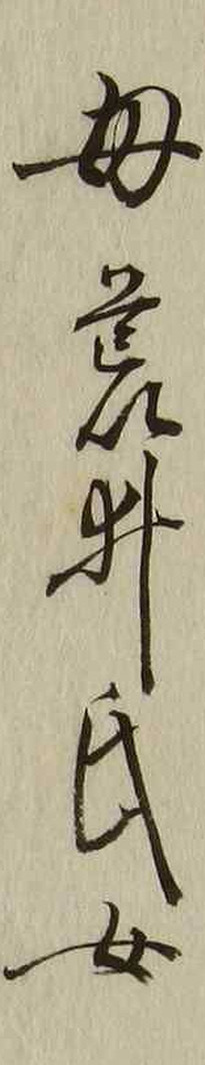母荒井氏女
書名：諸士系譜　巻之57　ほ之部4
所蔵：会津若松市立会津図書館
